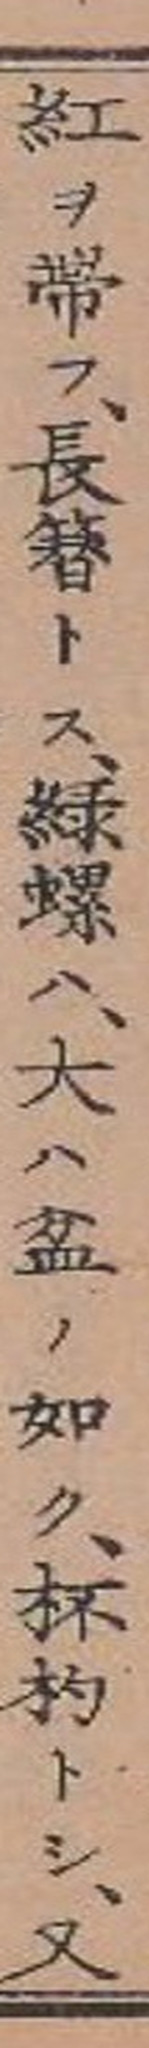紅ヲ帯フ、長簪トス、緑螺ハ、大ハ盆ノ如ク、杯杓トシ、又
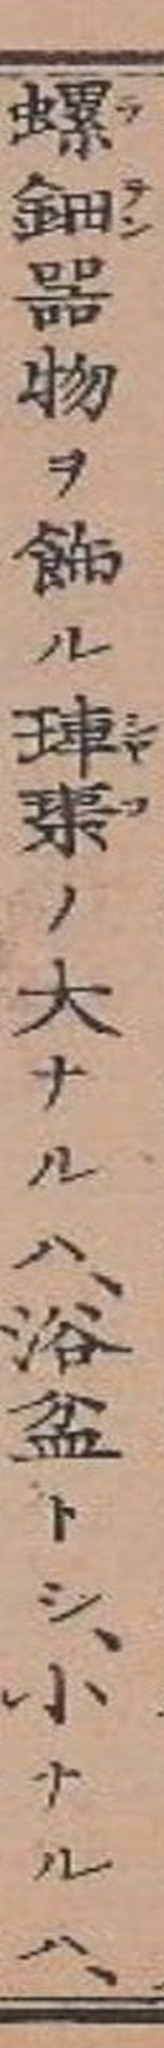螺鈿器物ヲ飾ルノ大ナルハ、浴盆トシ、小ナルハ、
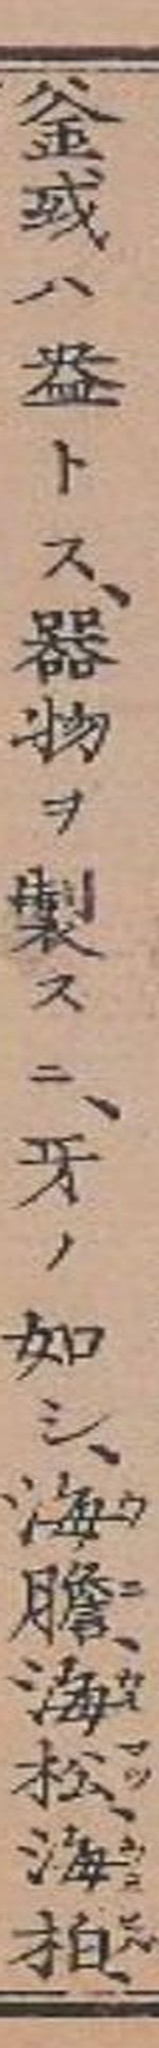釜或ハ盎トス、器物ヲ製スニ、牙ノ如シ、海胆、海松、海柏、
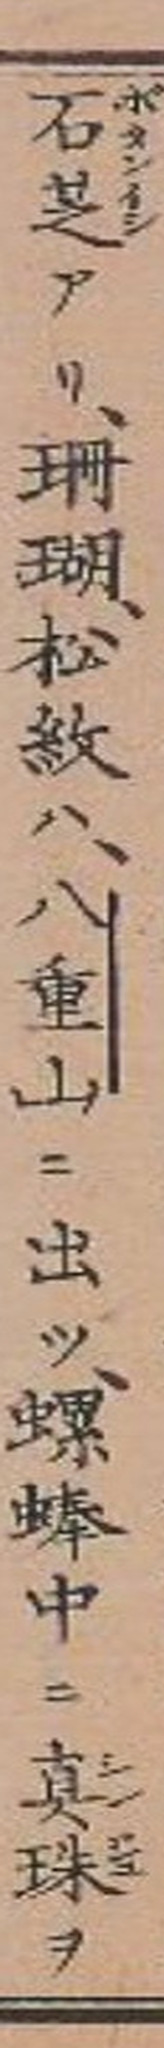石芝アリ、珊瑚、松紋ハ、八重山ニ出ツ、螺蜯中ニ真珠ヲ
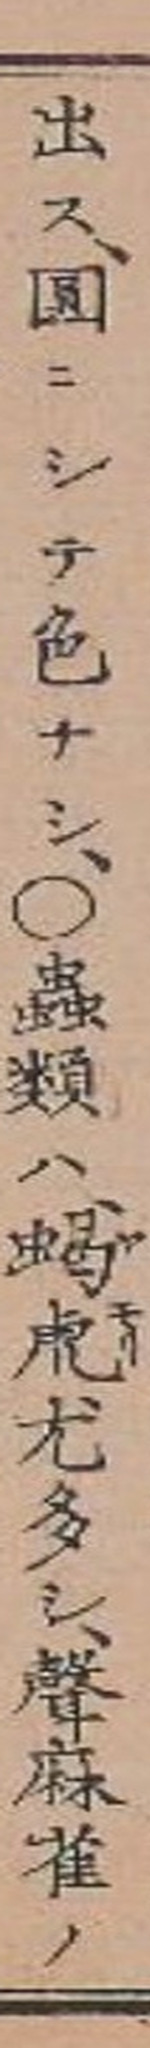出ス、円ニシテ色ナシ、○虫類ハ、蝎虎尤多シ、声麻雀ノ
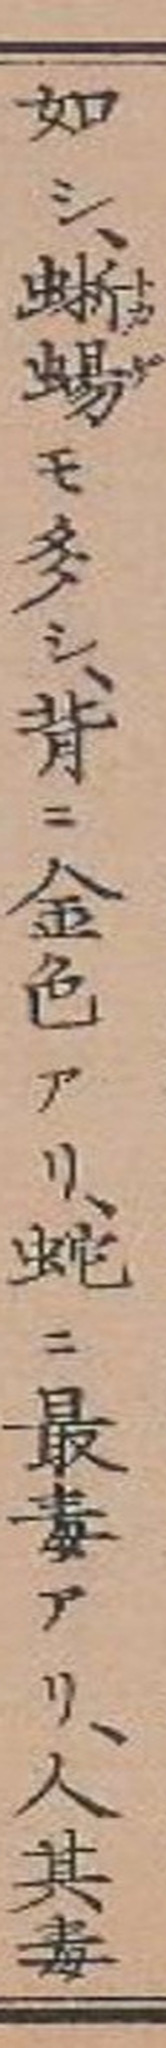如シ、蜥蜴モ多シ、背ニ金色アリ、蛇ニ最毒アリ、人其毒
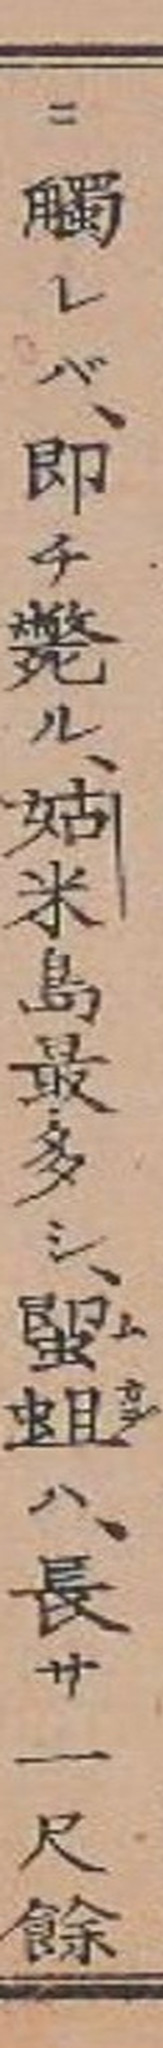ニ触レバ、即チ斃ル、姑米島最多シ、蝍蛆ハ、長サ一尺余
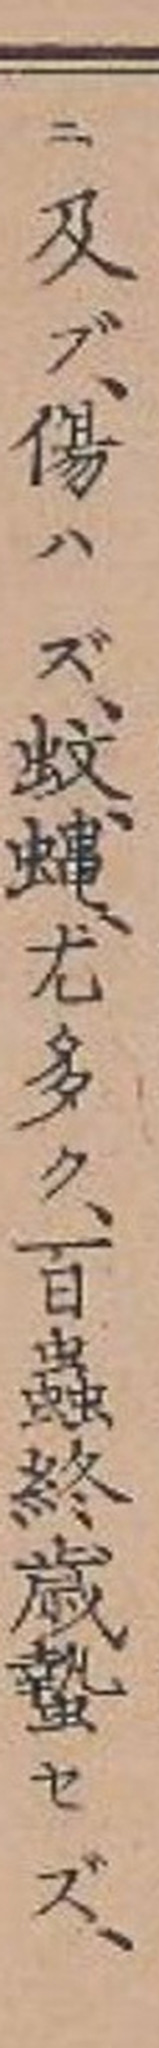ニ及ブ、傷ハズ、蚊、蠅、尤多ク、百虫終歳蟄セズ、
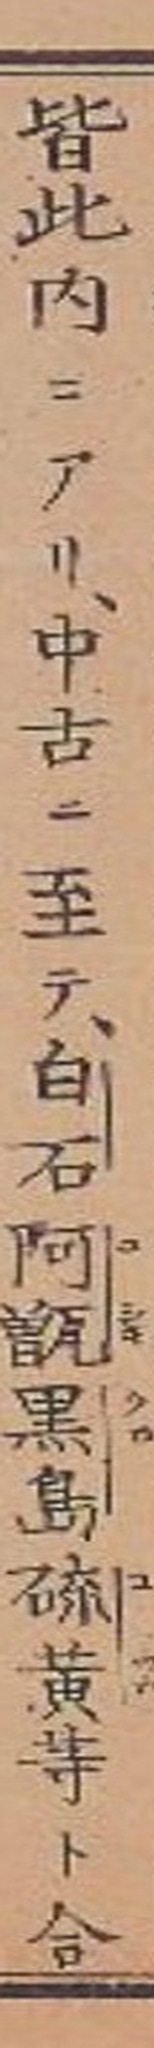皆此内ニアリ、中古ニ至テ、白石阿甑黒島硫黄等ト合
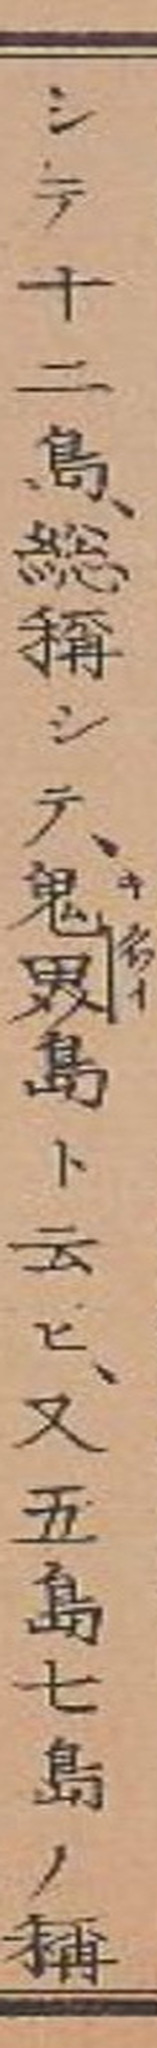シテ十二島、総称シテ、鬼界島ト云ヒ、又五島七島ノ称
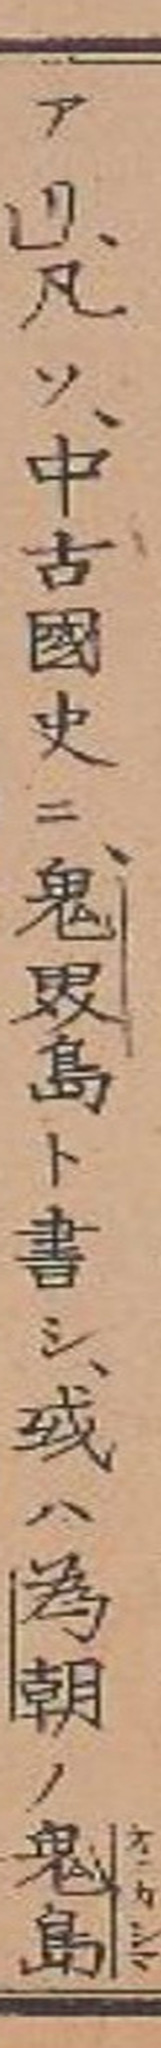アリ、」凡ソ、中古国史ニ、鬼界島ト書シ、或ハ為朝ノ鬼島
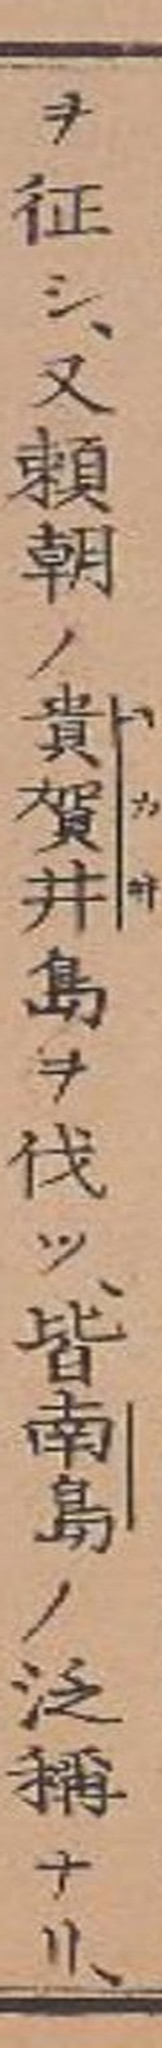ヲ征シ、又頼朝ノ貴賀井島ヲ伐ツ、皆南島ノ泛称ナリ、
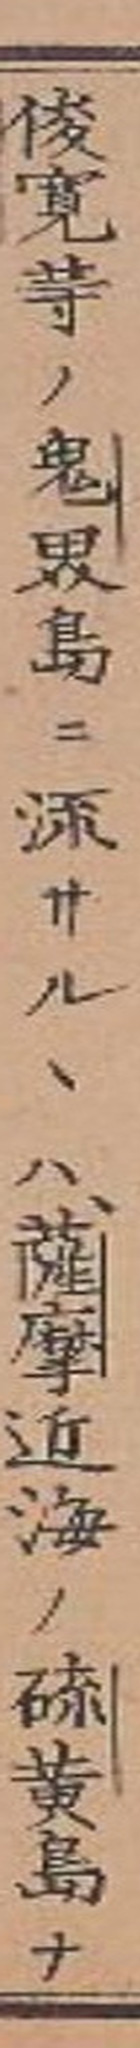俊寛等ノ鬼界島ニ流サルヽハ、薩摩近海ノ硫黄島ナ
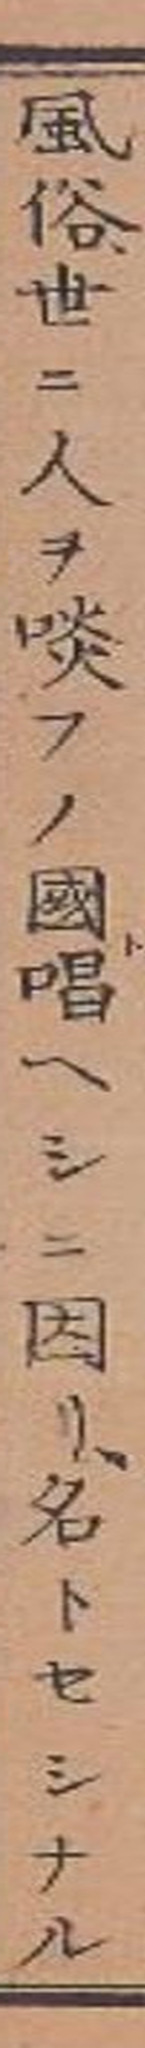風俗、世ニ人ヲ啖フノ国唱ヘシニ因リ、名トセシナル

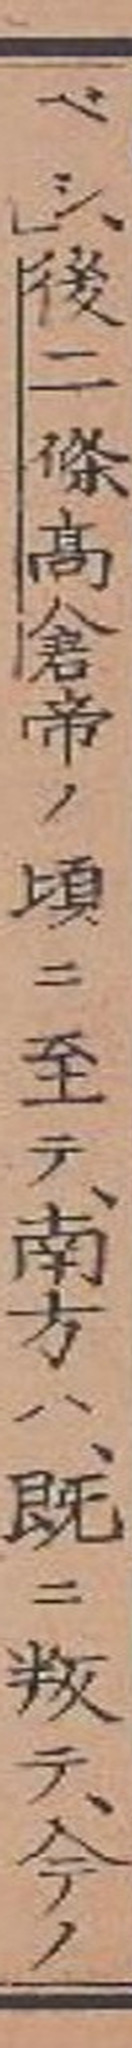ベシ、」後二条高倉帝ノ頃ニ至テ、南方ハ、既ニ叛テ、今ノ
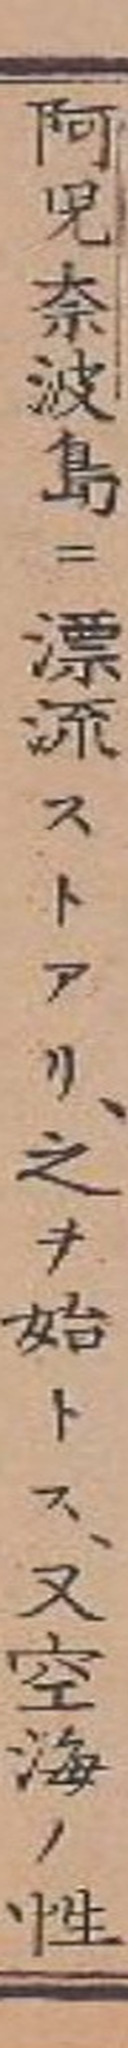阿児奈波島ニ漂流ストアリ、之ヲ始トス、又空海ノ性
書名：琉球新誌 巻上
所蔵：University of the Ryukyus Library
